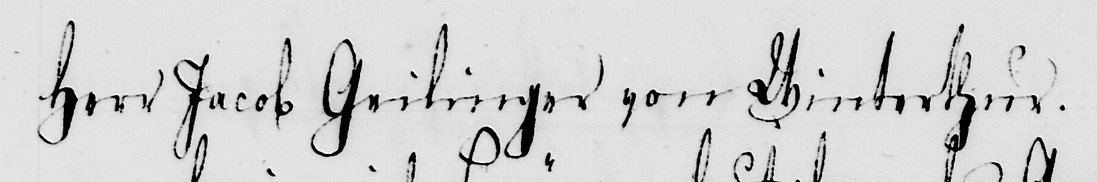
Herr Jacob Geilinger von Winterthur.
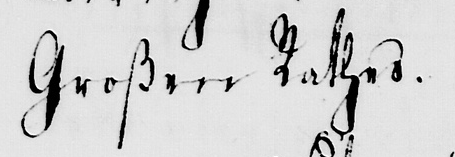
Großen Rathes.
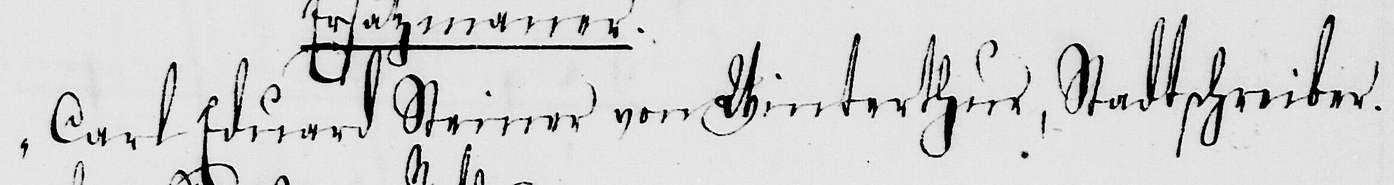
Carl Eduard Steiner von Winterthur, Stadtschreiber
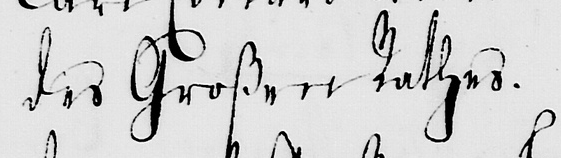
des Großen Rathes.
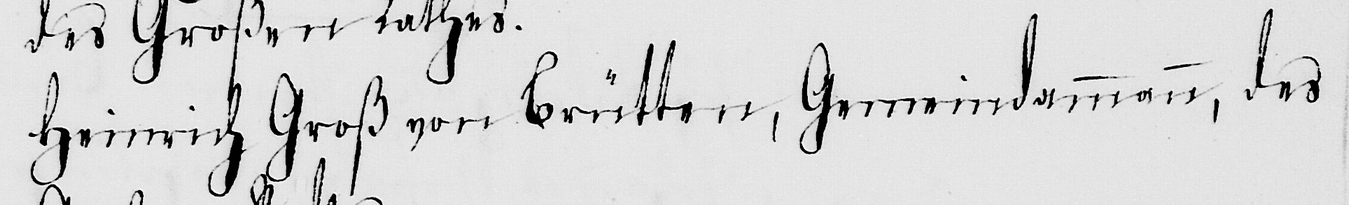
Heinrich Groß von Brütten, Gemeindammann, des
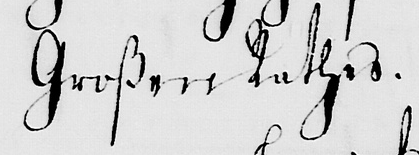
Großen Rathes
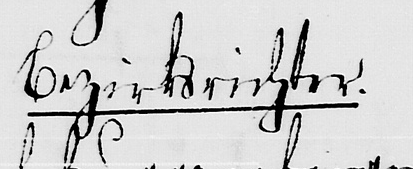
Bezirksricht¬
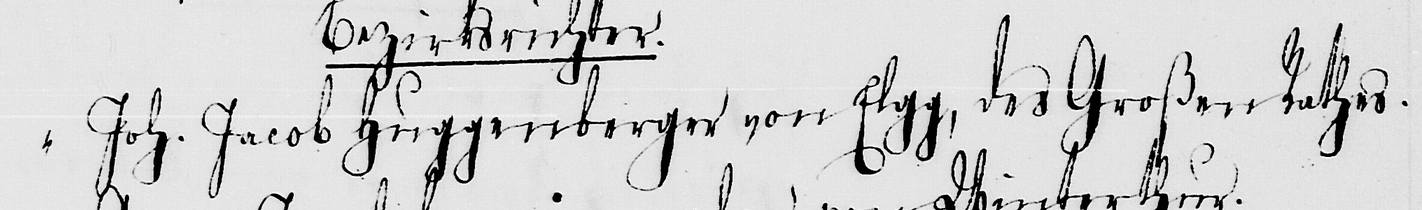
“ Joh. Jacob Huggenberger von Elgg, des Großen Rathes.
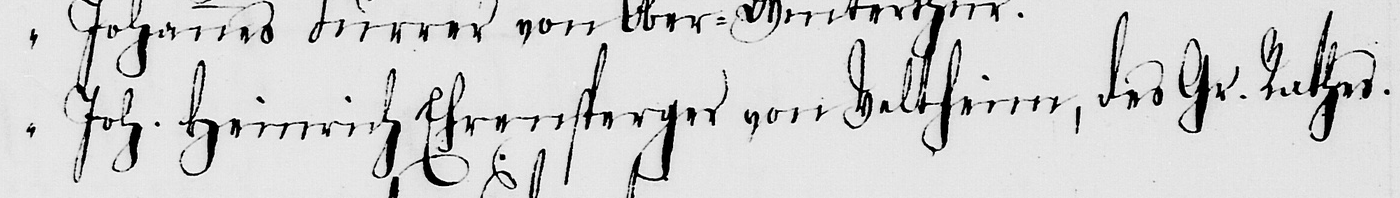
“ Joh. Heinrich Ehrensperger von Veltheim, des Gr. Rathes.
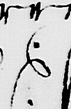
er.
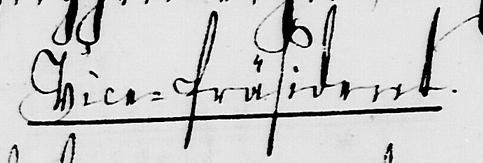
Vice-Präsident.
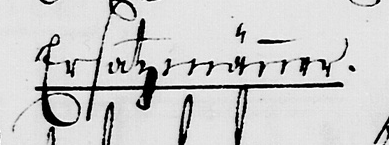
Ersatzmänner.
